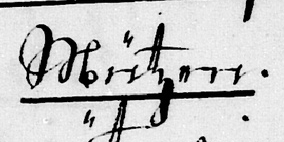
Mützen.
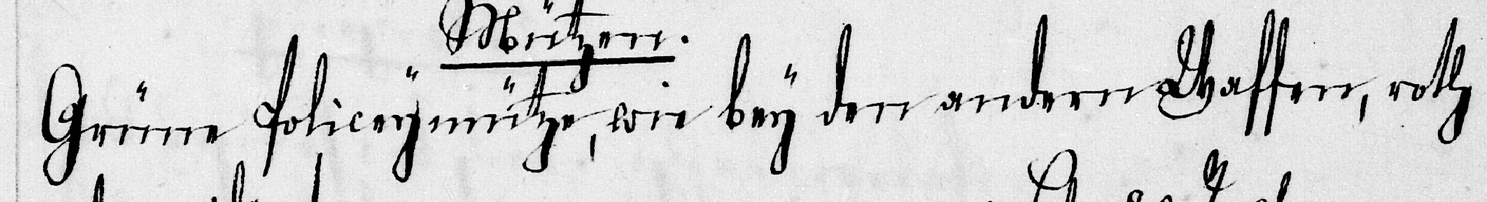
Grüne Policeymütze, wie bey den andern Waffen, roth
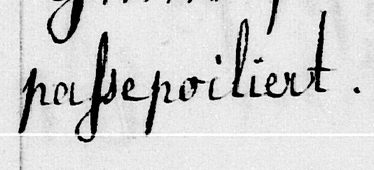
passepoiliert.
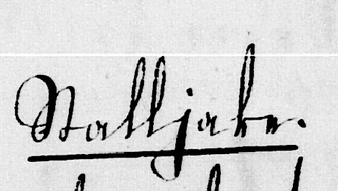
Stalljake.
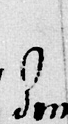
5.
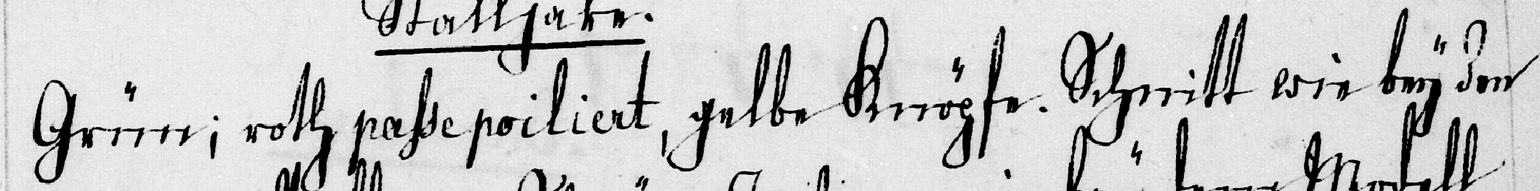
Grün; roth passepoiliert, gelbe Knöpfe. Schnitt wie bey den
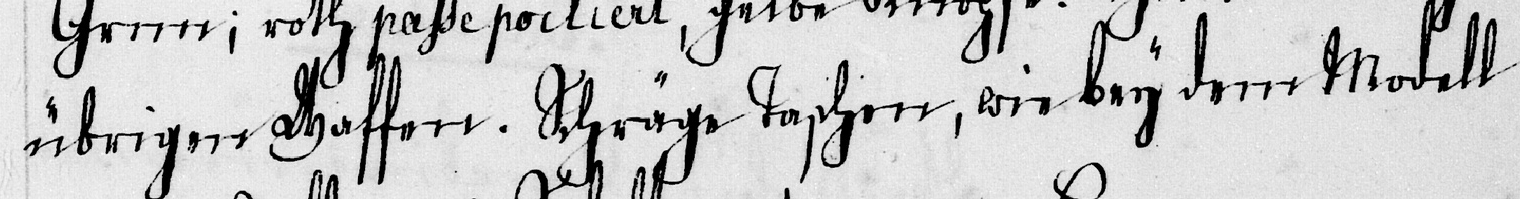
übrigen Waffen. Schräge Taschen, wie bey dem Modell
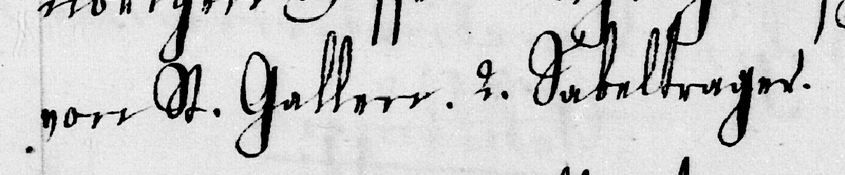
von St. Gallen. 2. Sabeltrager.
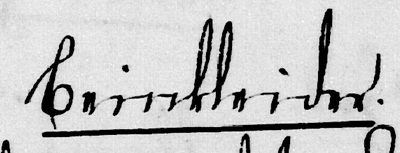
Beinkleider.
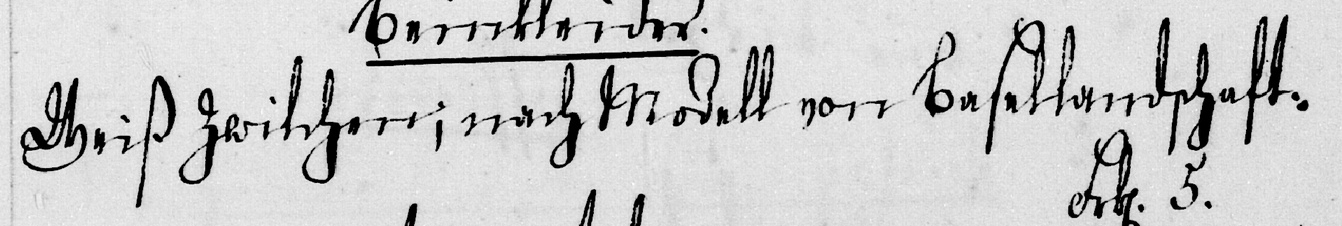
Weiß Zwilchen; nach Modell von Basellandschaft.
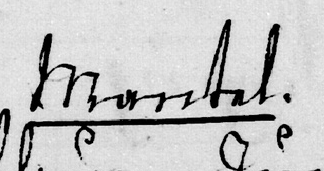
Mantel.
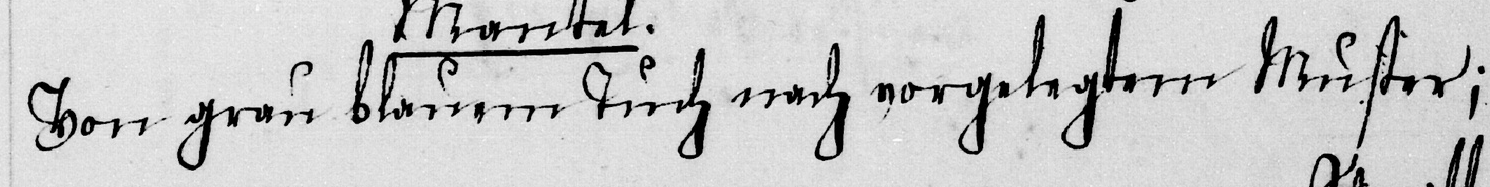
Von grau blauem Tuch nach vorgelegtem Muster;
